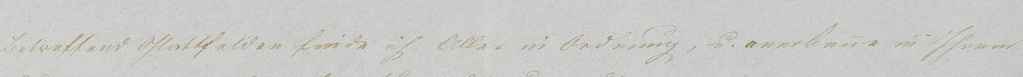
Betreffend Glattfelden finde ich Alles in Ordnung, u. anerkenne in Ihrem
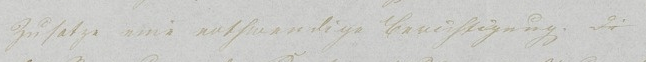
Zusatze eine nothwendige Berichtigung. Die
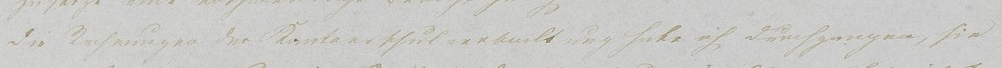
Die Rechnungen der Kantonsschulverwaltung habe ich durchgangen, sie
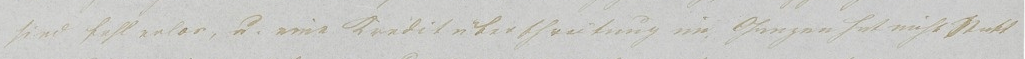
sind fehlerlos, u. eine Kreditüberschreitung im Ganzen hat nicht Statt
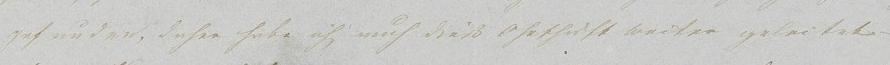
gefunden, daher habe ich auch dieß Geschäft weiter geleitet. –
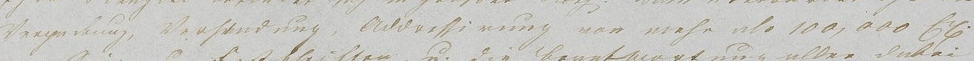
Verpackung, Versendung, Addressirung von mehr als 100,000 Ex.
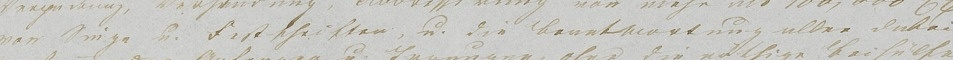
von Sing–u. Festschriften, u. die Beantwortung aller dabei
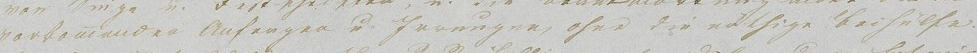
vorkommenden Anfragen u. Irrungen, ohne die nöthige Beihülfe.
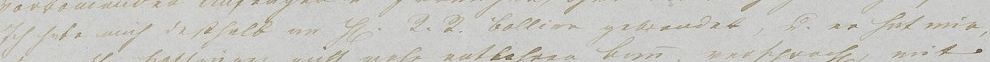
Ich habe mich deßhalb an H. R.R. Bollier gewendet, u. er hat mir,
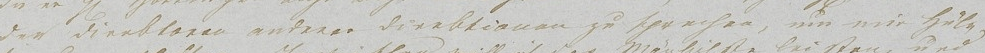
den Direktoren anderer Direktionen zu sprechen, um mir Hül-
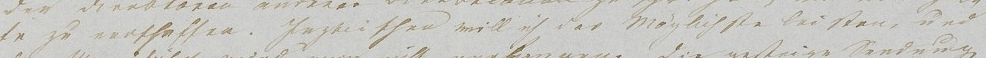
fe zu verschaffen. Inzwischen will ich das Möglichste leisten, und
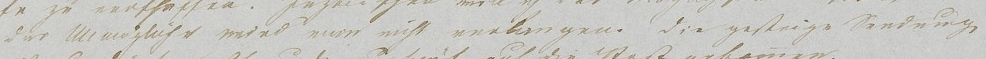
das Unmögliche wird man nicht verlangen. Die gestrige Sendung
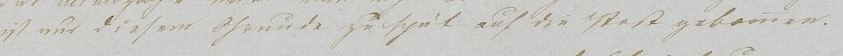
ist aus diesem Grunde zu spät auf die Post gekommen.
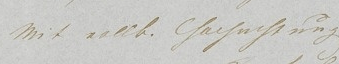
Mit vollk. Hochachtung
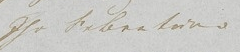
Ihr Sekretär:
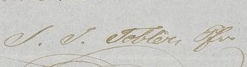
J. J. Tobler Pfr.
